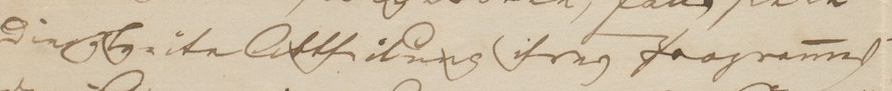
die zweite Abtheilung ihres Programmes
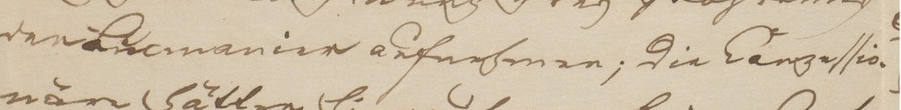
den Lucmanier aufnehmen; die Conzessio-
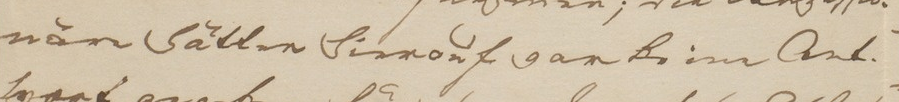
näre hätten hierauf gar keine Ant-
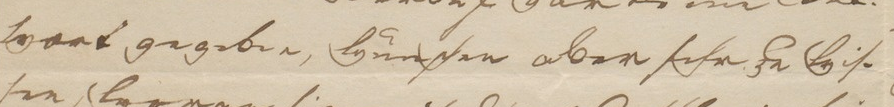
wort gegeben, wünschten aber sehr zu wis-
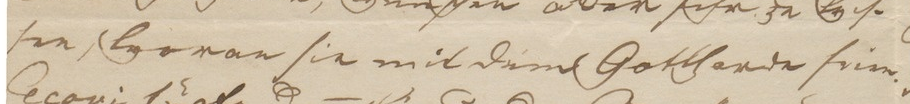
sen, woran sie mit dem Gottharde seien.
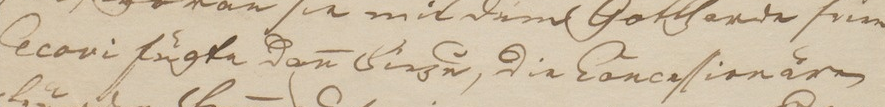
Cecovi fügte dann hinzu, die Concessionäre
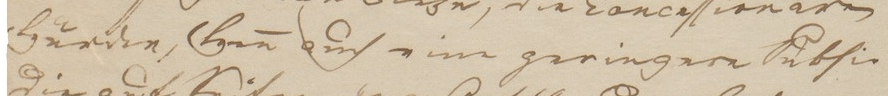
würden, wenn auch eine geringere Subsi-
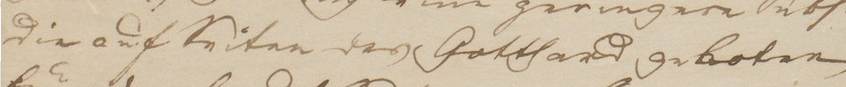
die auf Seiten des Gotthard geboten
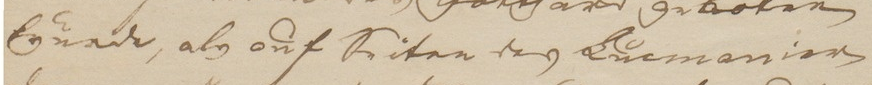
würde, als auf Seiten des Lucmanier
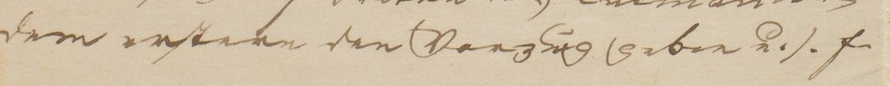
dem erstern den Vorzug geben u. s. f.
